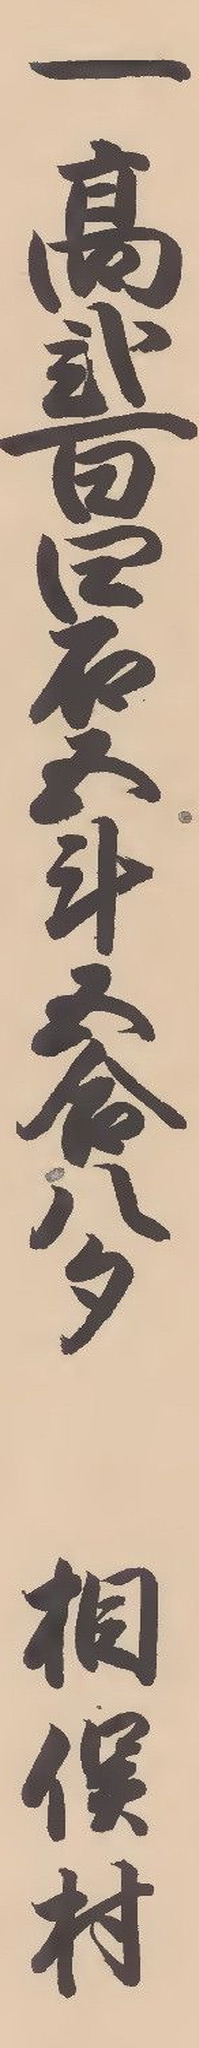一高弐百四石五斗五合八勺相俣村
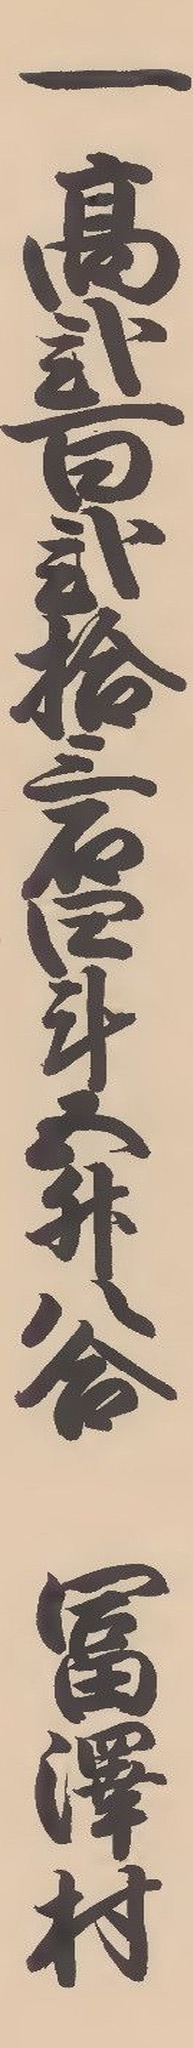一高弐百弐拾三石四斗五升八合富沢村
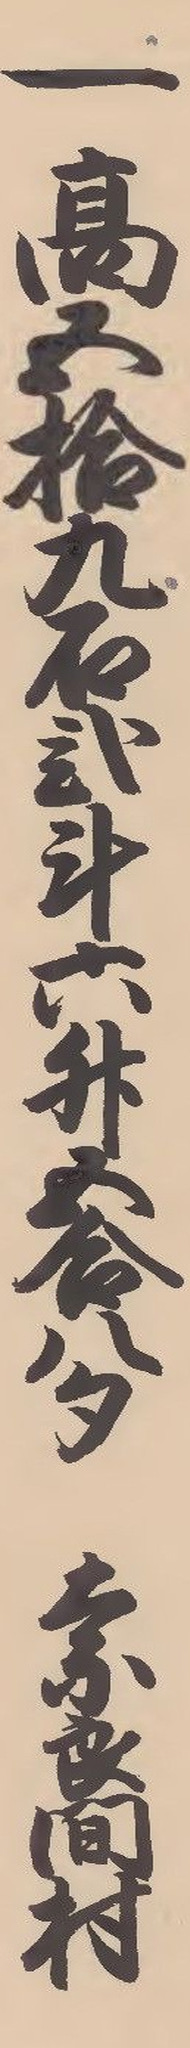一高五拾九石弐斗六升五合八勺奈良間村
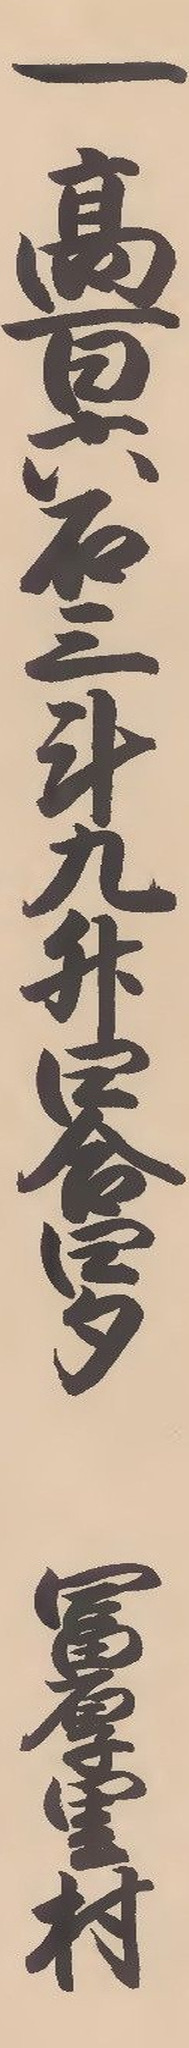一高百六石三斗九升四合四勺富厚里村
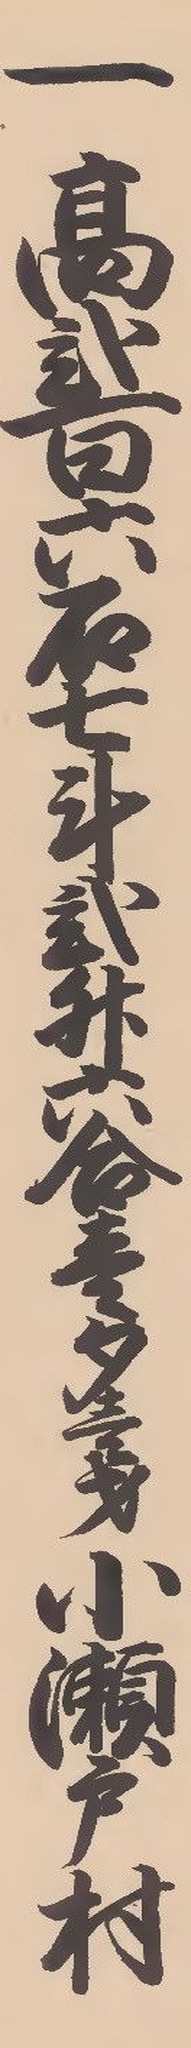一高弐百六石七斗弐升六合壱勺壱才小瀬戸村
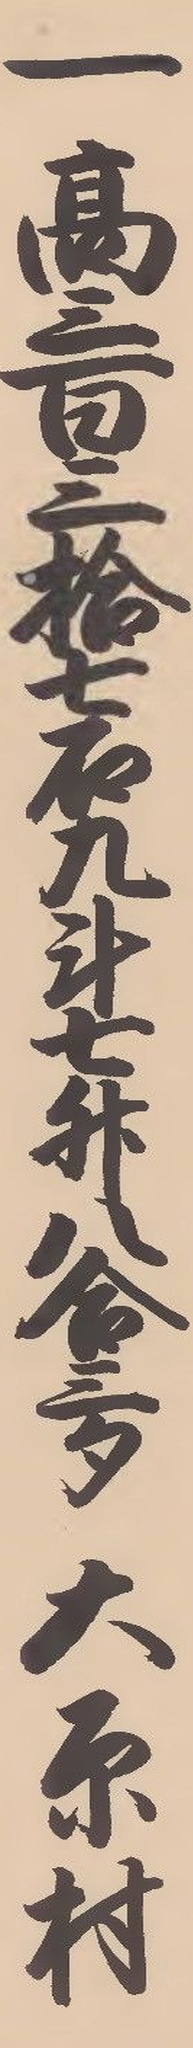一高三百三拾七石九斗七升八合三勺大原村
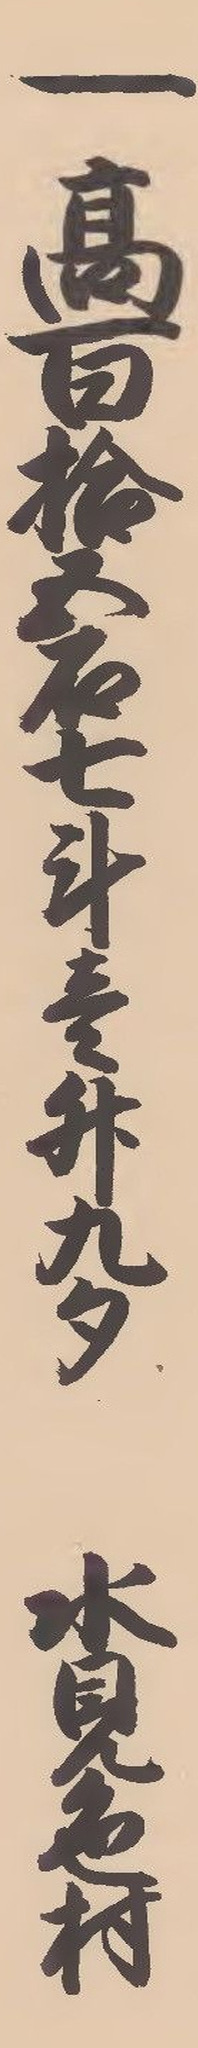一高百拾五石七斗壱升九勺水見色村
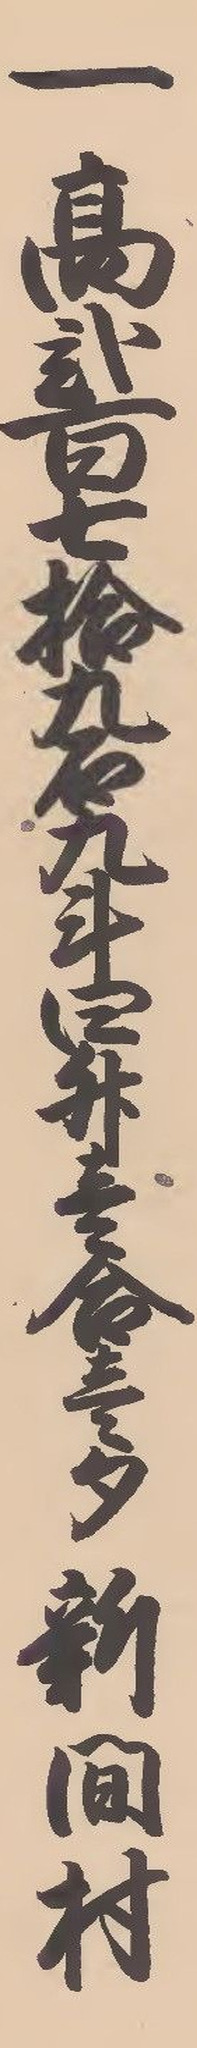一高弐百七拾九石九斗四升壱合壱勺新間村

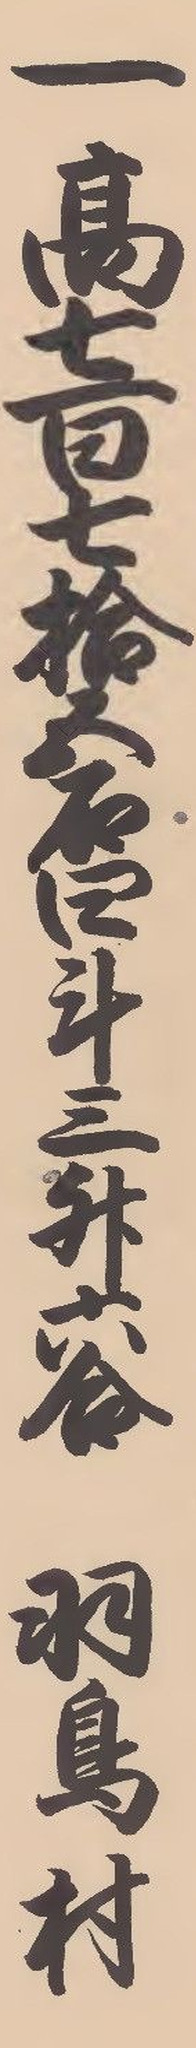一高百七拾五石四斗三升六合羽鳥村
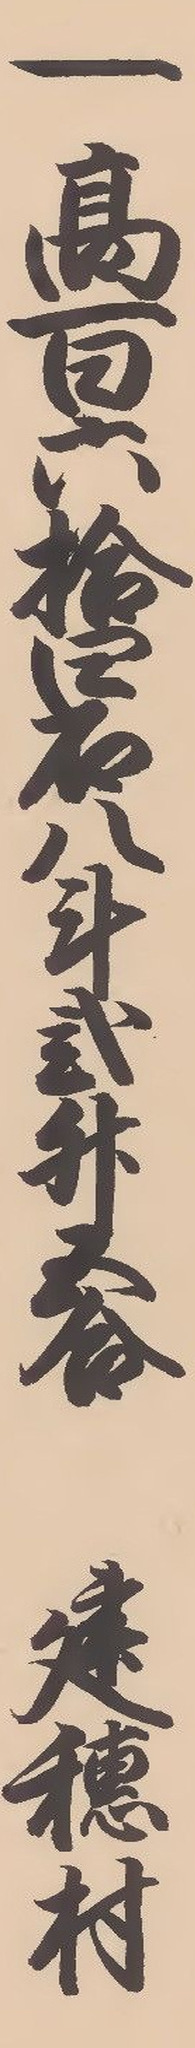一高百六拾四石八斗弐升五合建穂村
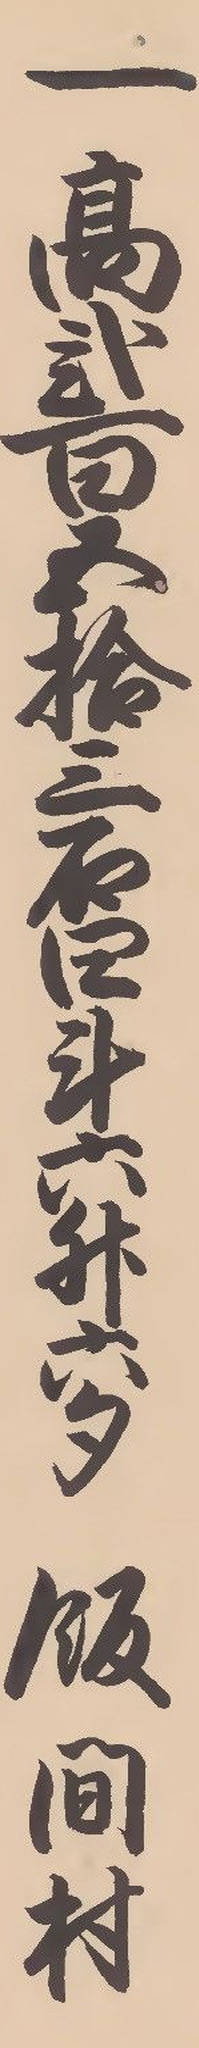一高弐百五拾三石四斗六升六勺飯間村
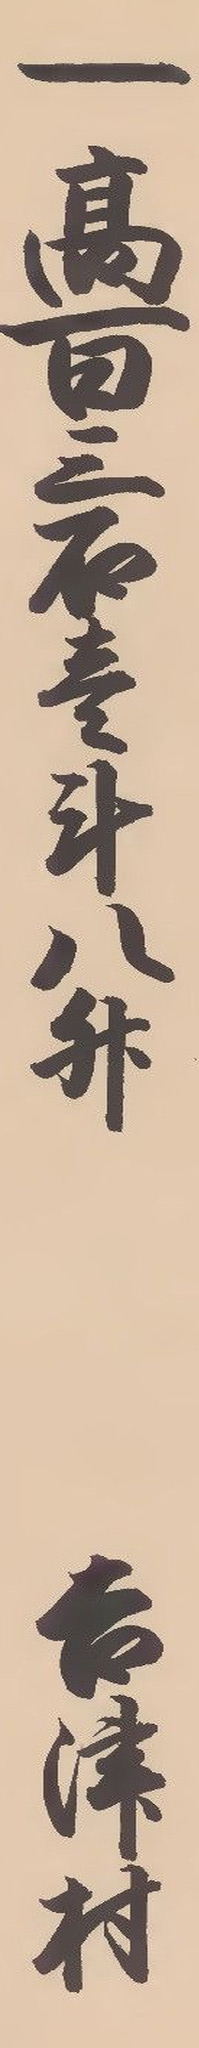一高百三石壱斗八升吉津村
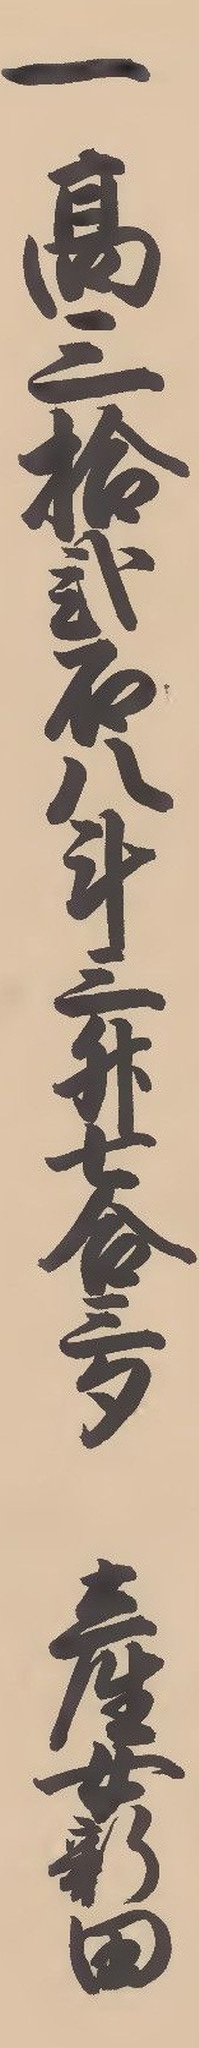一高三拾弐石八斗三升七合三勺産女新田
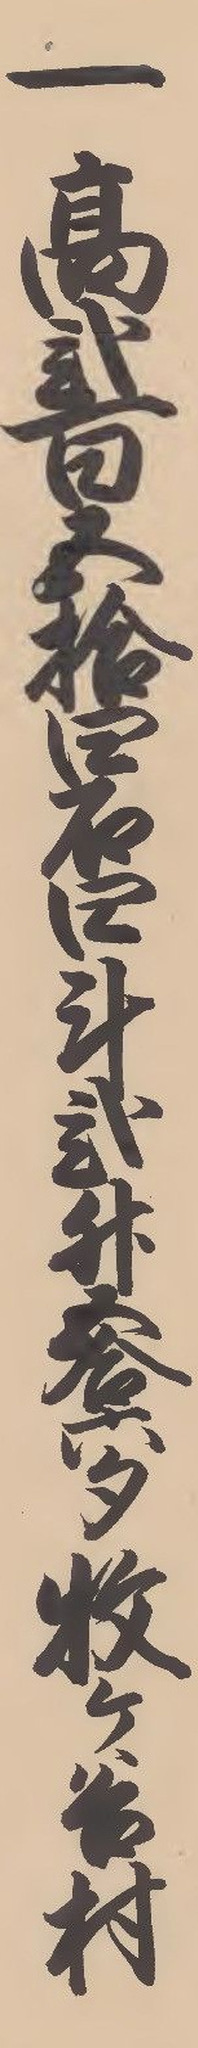一高弐百五拾四石四斗弐升五合六勺牧ヶ谷村
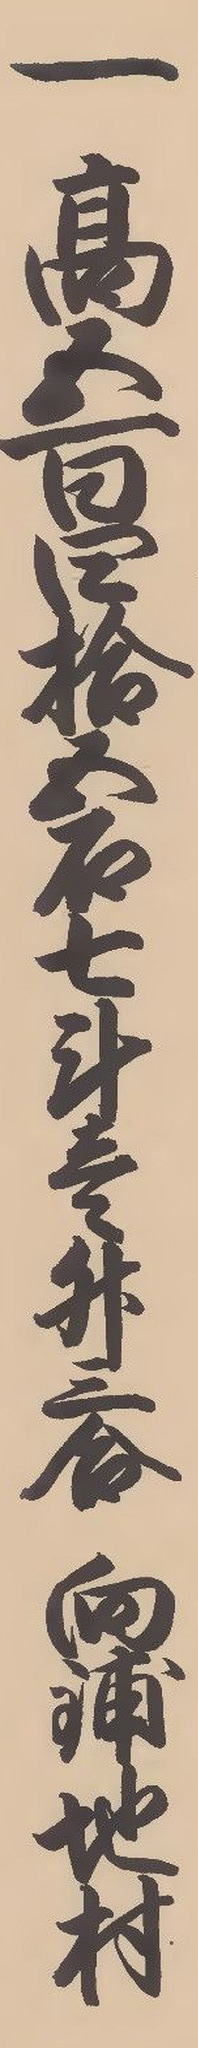一高五百四拾五石七斗壱升三合向鋪地村
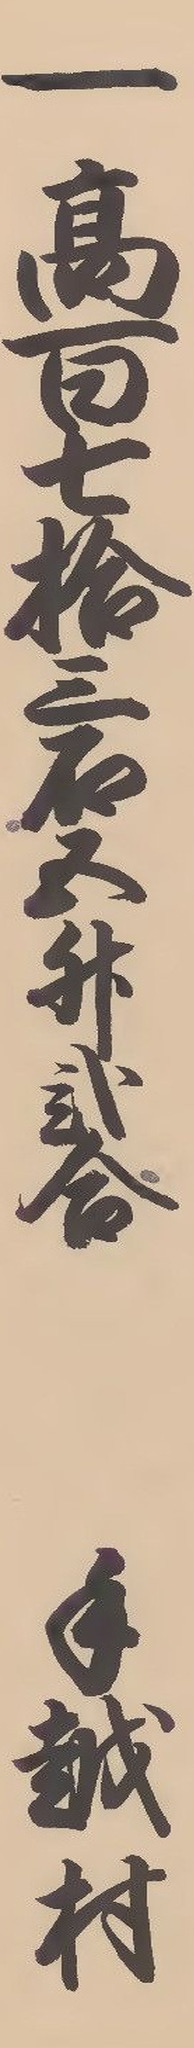一高百七拾三石五升弐合手越村
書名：駿河国郷帳
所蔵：国立公文書館 National Archives of Japan
